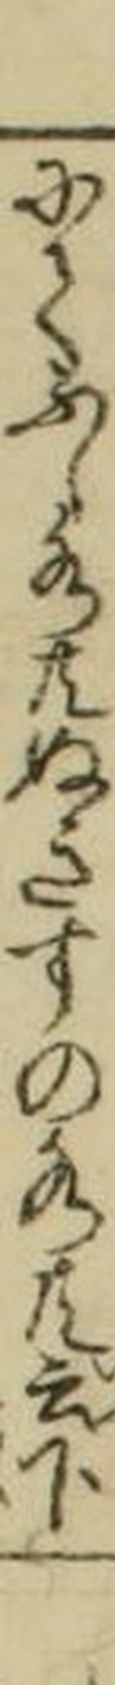にてふし水共ぬきすの水とも云下
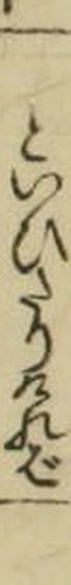といひたりければ
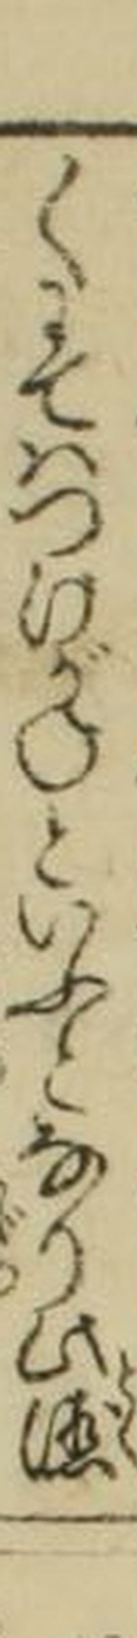〳〵にてはつけがねといふとなり此徳
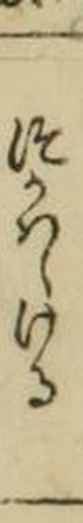つかはしける
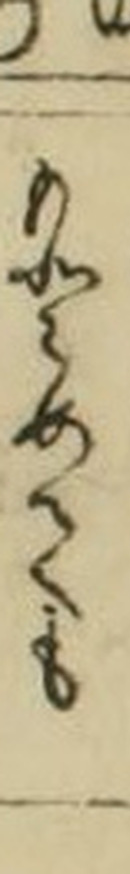もとめても
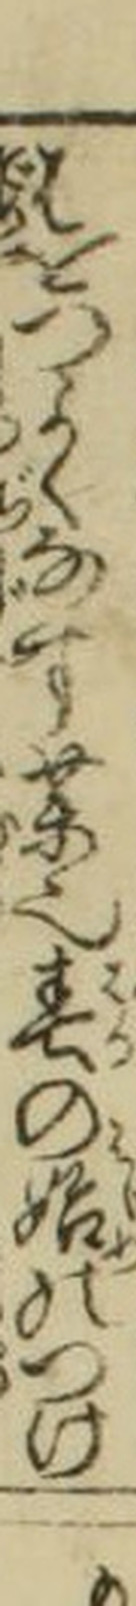はをつよくなす薬也春の始のつけ
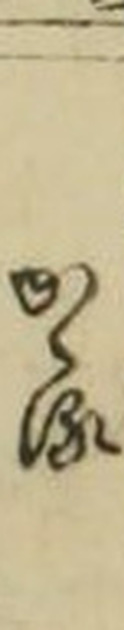かゝる
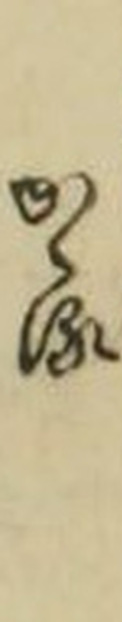かゝる
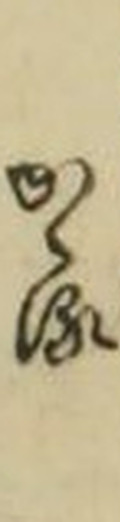かゝる
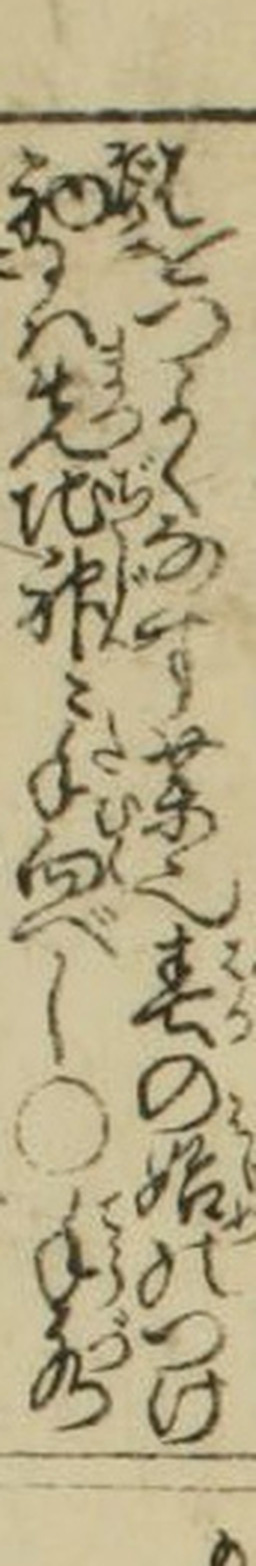初には先地神に手向べし◯手水
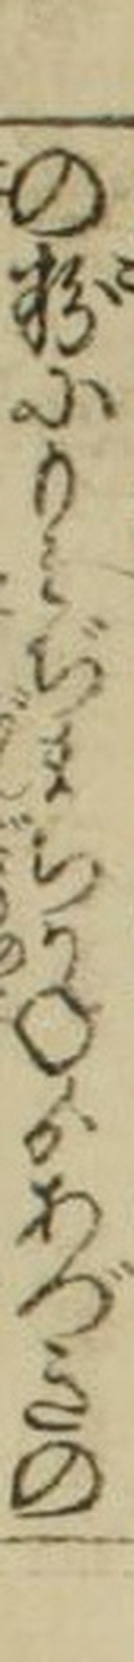の粉にもみぢまちりてよりあづきの
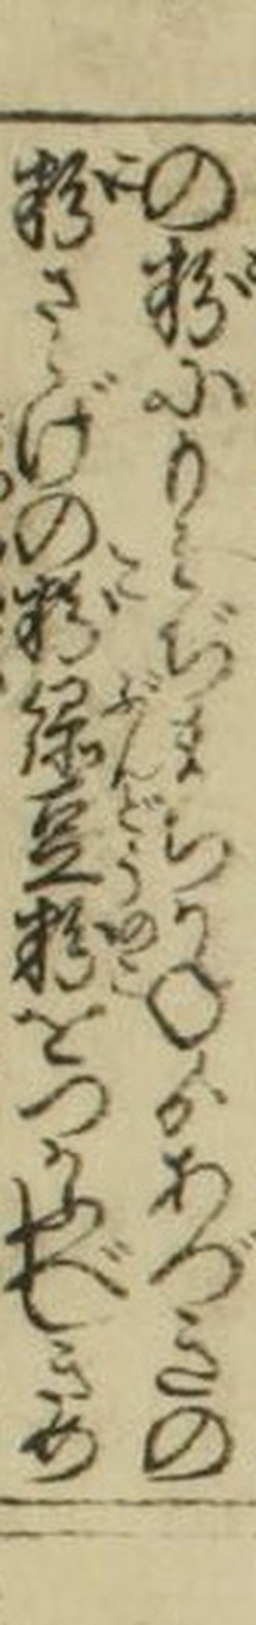粉さゝげの粉緑豆粉をつかふべしきめ
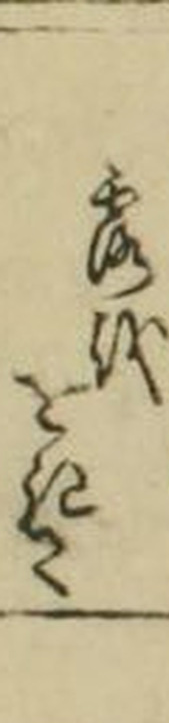をきて
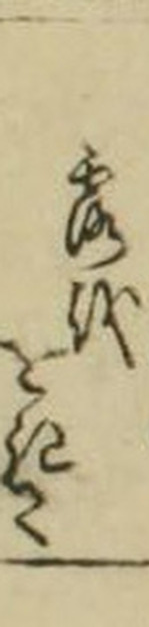をきて
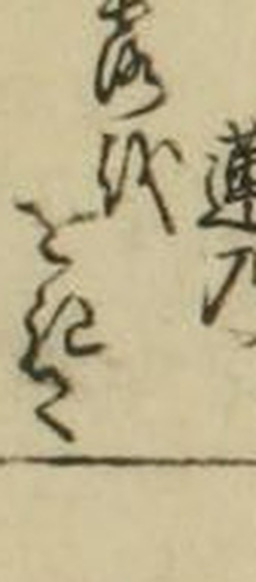をきて
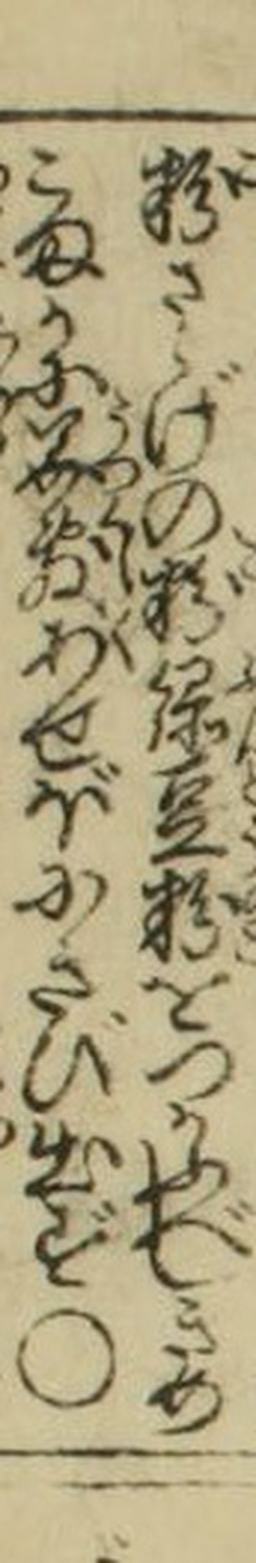こまかに美敷あせぼにさび出ず◯
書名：女源氏教訓鑑
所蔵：東京学芸大学附属図書館
